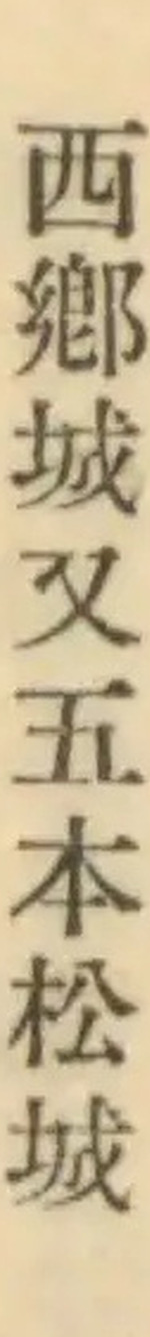西郷城又五本松城
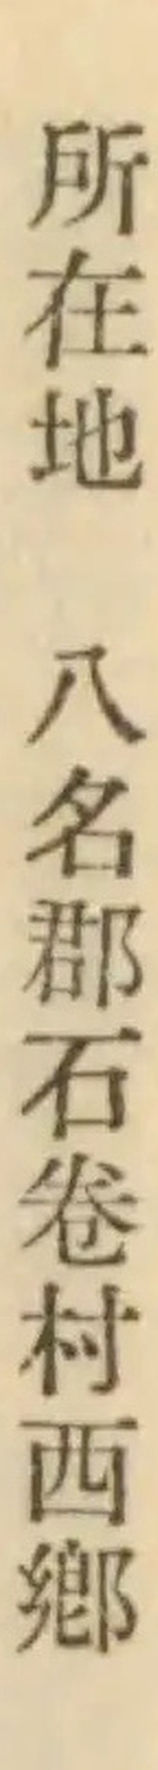所在地八名郡石巻村西郷
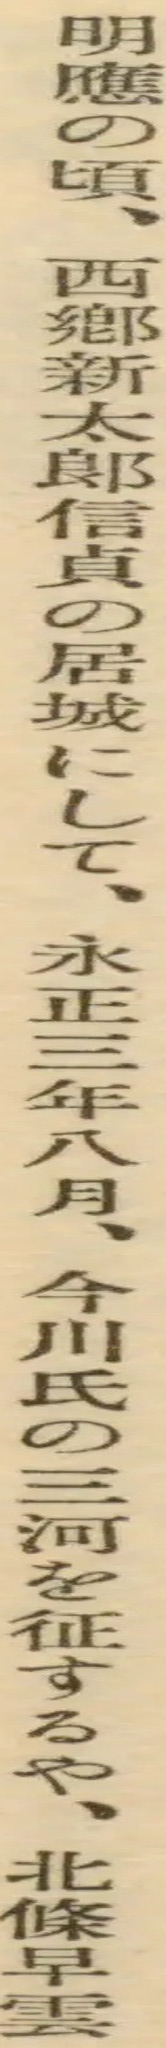明応の頃、西郷新太郎信貞の居城にして、永正三年八月、今川氏の三河を征するや、北條早雲
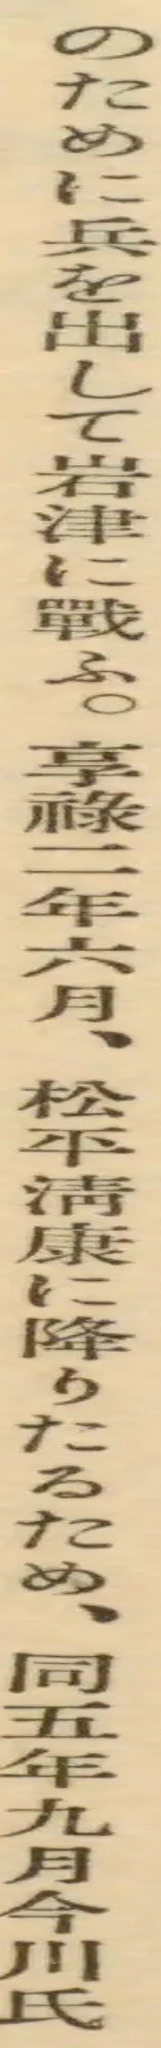のために兵を出して岩津に戦ふ。享禄二年六月、松平清康に降りたるため、同五年九月今川氏
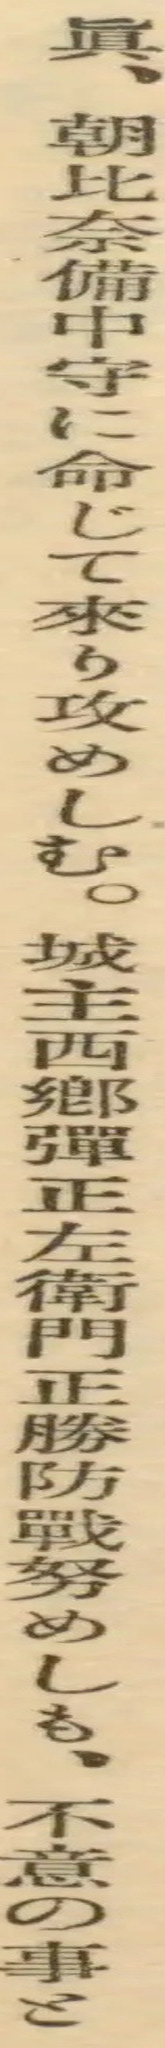真、朝比奈備中守に命じて来り攻めしむ。城主西郷弾正左衛門正勝防戦努めしも、不意の事と
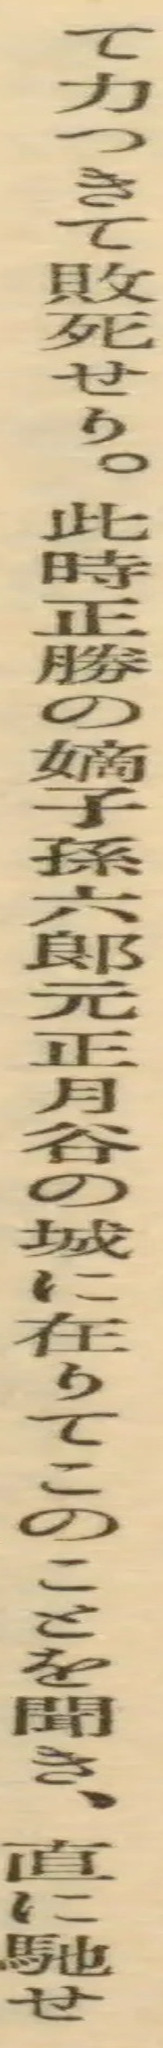て力つきて敗死せり。此時正勝の嫡子孫六郎元正月谷の城に在りてこのことを聞き、直に馳せ
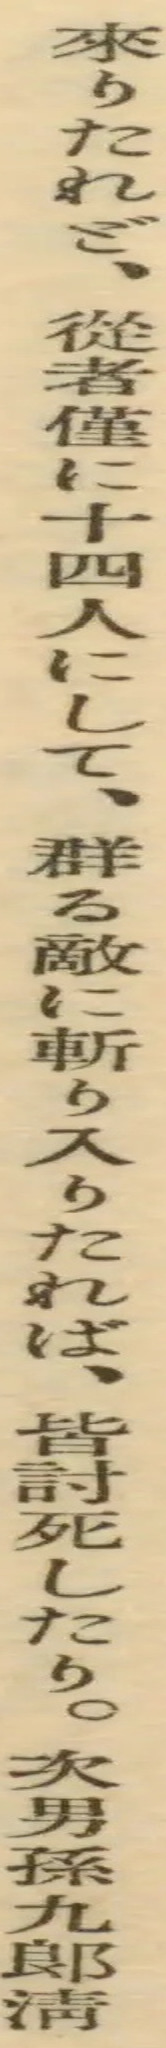来りたれど、従者僅に十四人にして、群る敵に斬り入りたれば、皆討死したり。次男孫九郎清
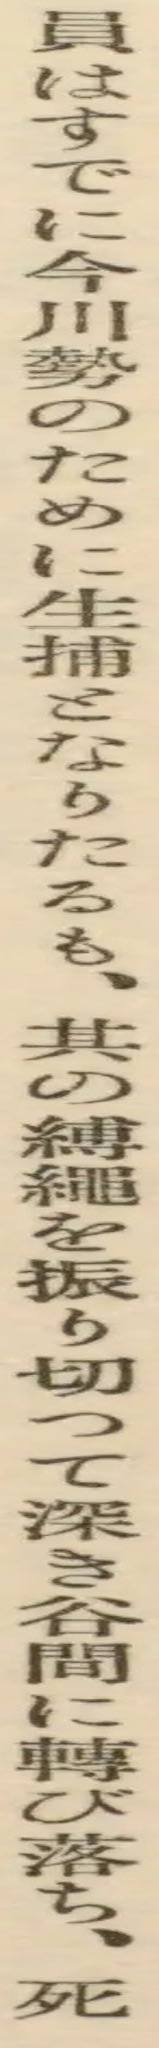員はすでに今川勢のために生捕となりたるも、其の縛縄を振り切つて深き谷間に転び落ち、死
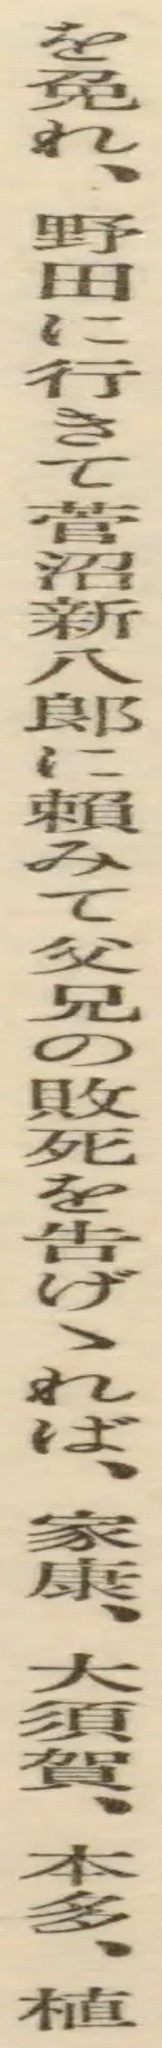を免れ、野田に行きて菅沼新八郎に頼みて父兄の敗死を告げゝれば、家康、大須賀、本多、植
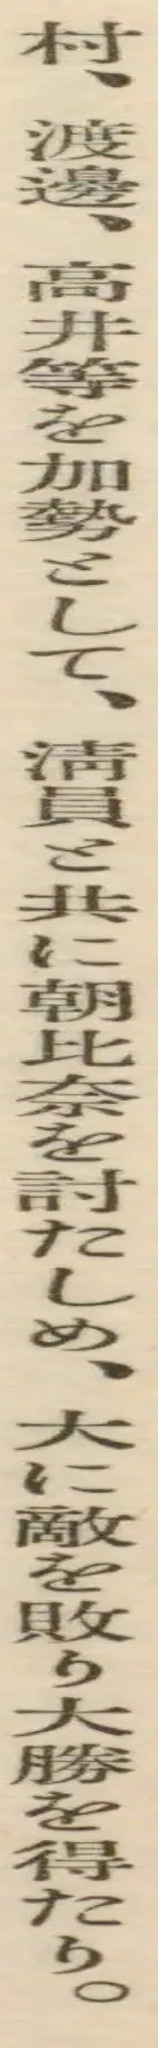村、渡邊、高井等を加勢として、清員と共に朝比奈を討たしめ、大に敵を敗り大勝を得たり。
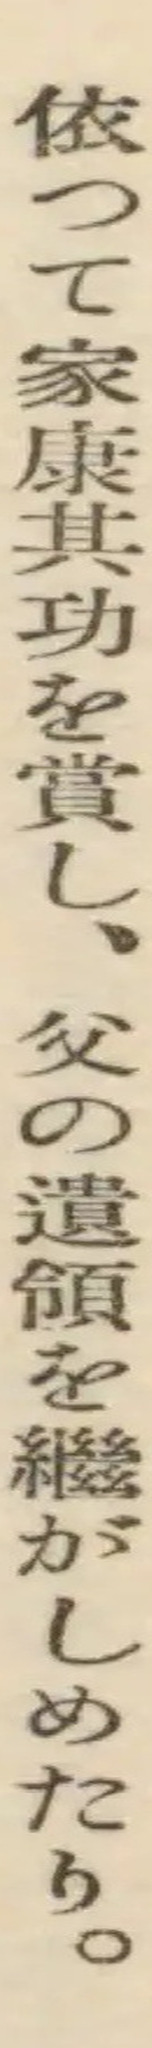依つて家康其功を賞し、父の遺領を継がしめたり。
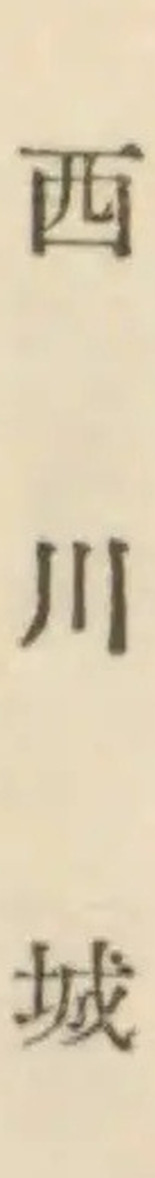西川城
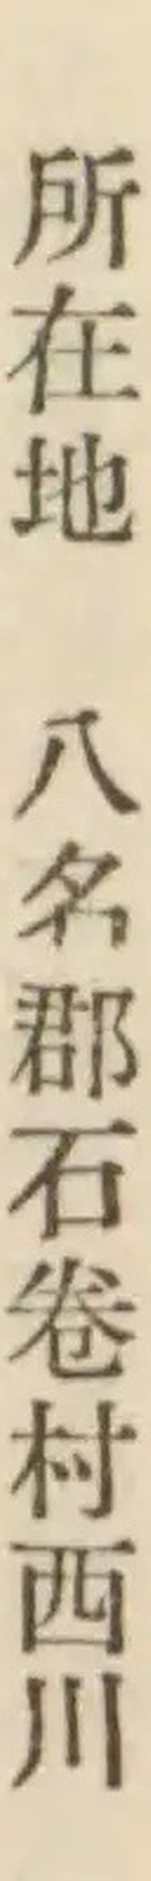所在地八名郡石巻村西川
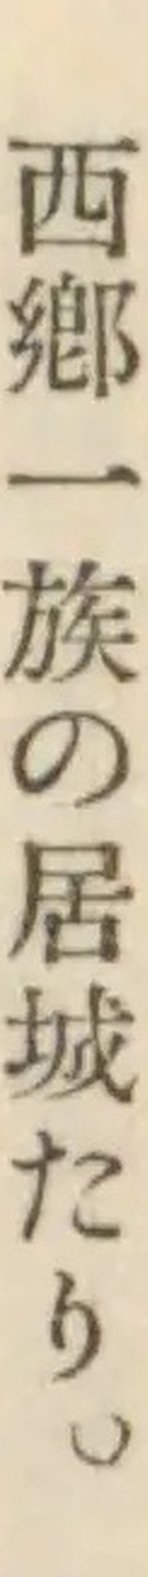西郷一族の居城たり。
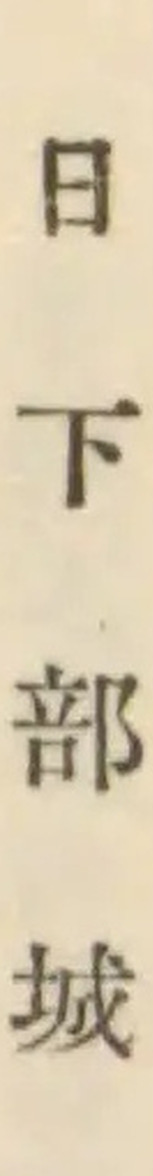日下部城
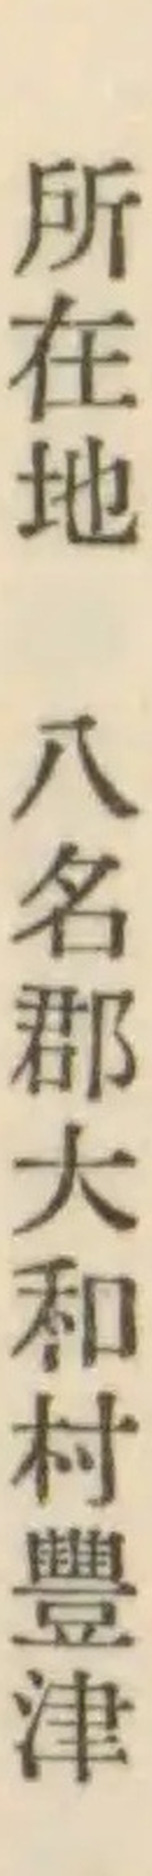所在地八名郡大和村豊津
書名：東三河之古城
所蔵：国立国会図書館 National Diet Library, JAPAN
